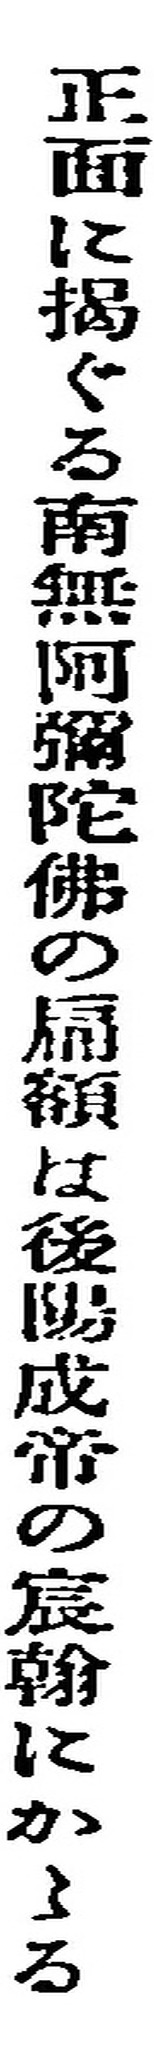正面に揭ぐる南無阿彌陀佛の扁額は後陽成帝の宸翰にかゝる
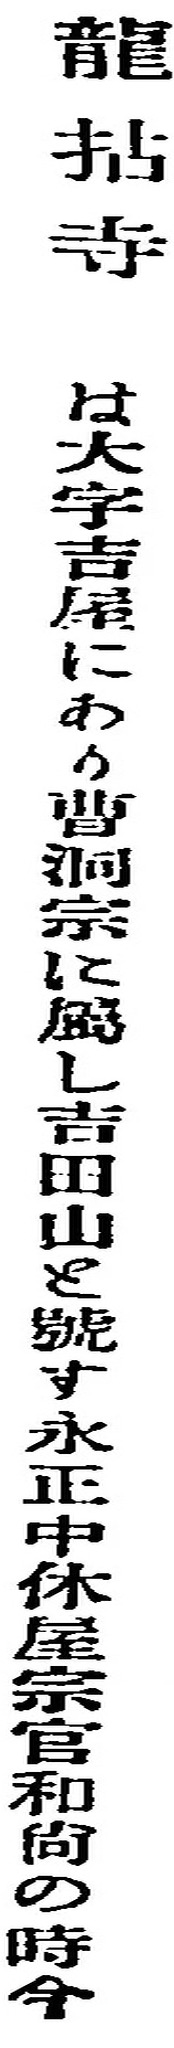龍拈寺は大字吉屋にあり曹洞宗に屬し吉田山と號す永正中休屋宗官和尚の時今
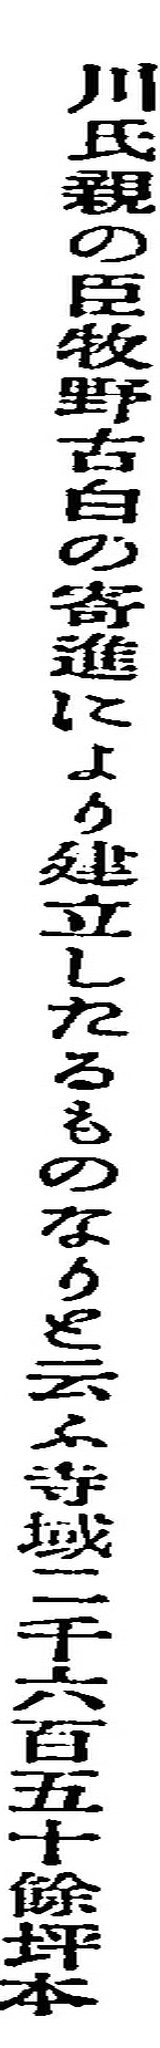川氏親の臣牧野古白の寄進により建立したるものなりと云ふ寺域二千六百五十餘坪本
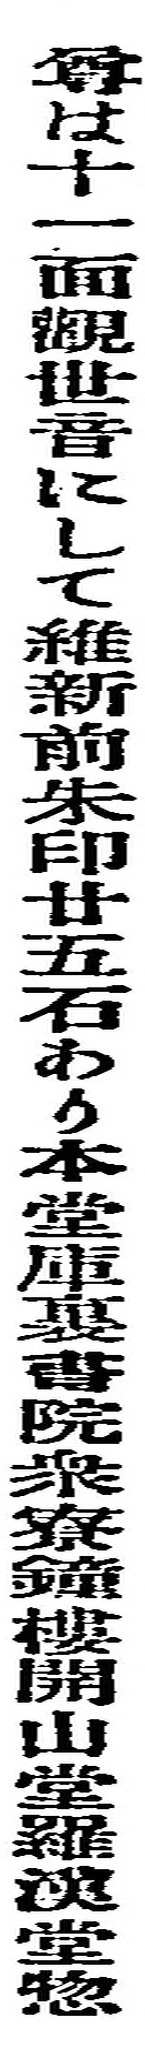尊は十一面觀世音にして維新前朱印廿五石あり本堂庫裏書院衆寮鐘樓開山堂羅漢堂惣
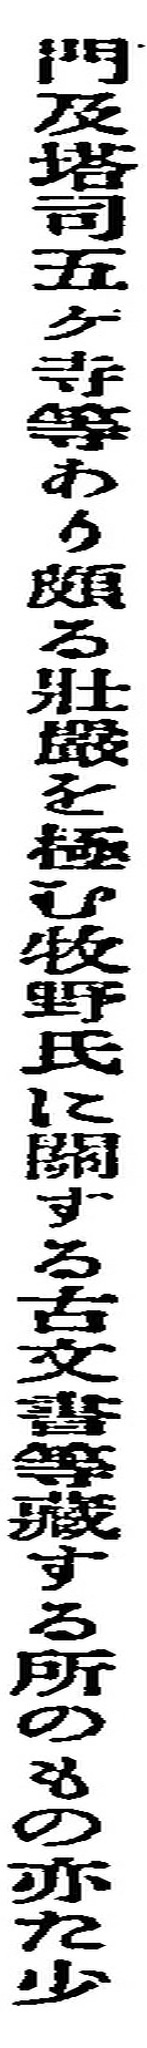門及塔司五ヶ寺等あり頗る壯嚴を極む牧野氏に關する古文書等藏する所のもの亦た少
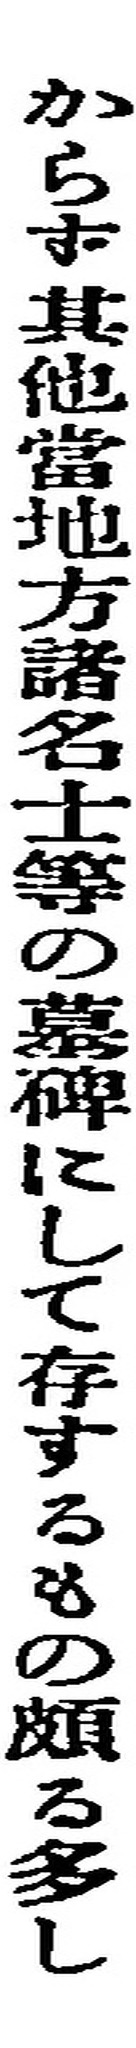からず其地當地方諸名士等の墓碑にして存するもの頗る多し
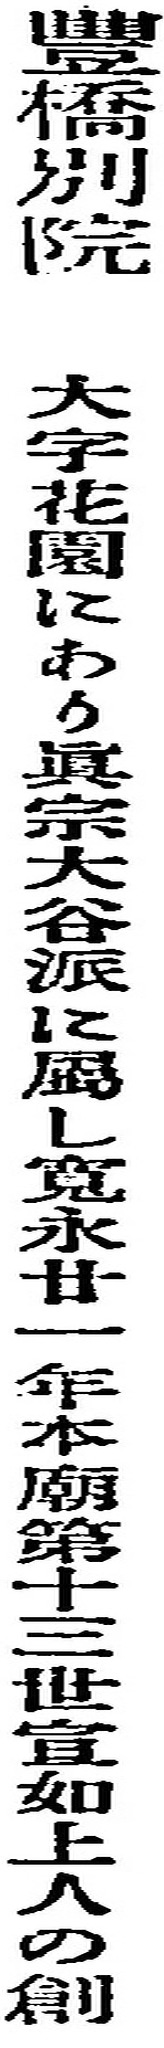豐橋別院大字花園にあり眞宗大谷派に屬し寛永廿一年本廟第十三世宣如上人の創
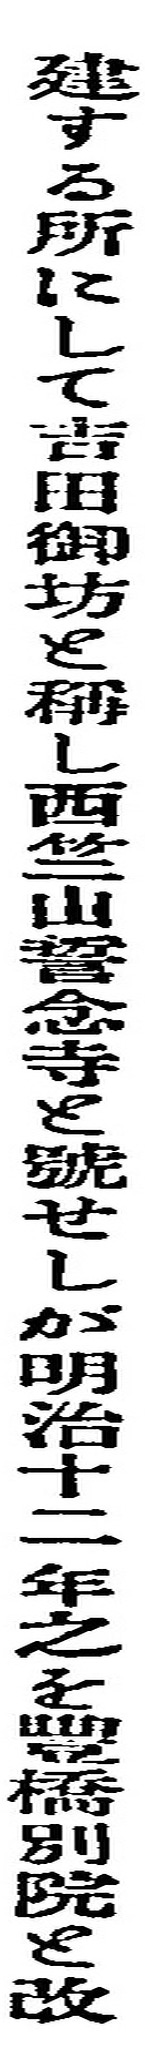建する所にして吉田御坊と稱し西竺山誓念寺と號せしが明治十二年之を豐橋別院と改
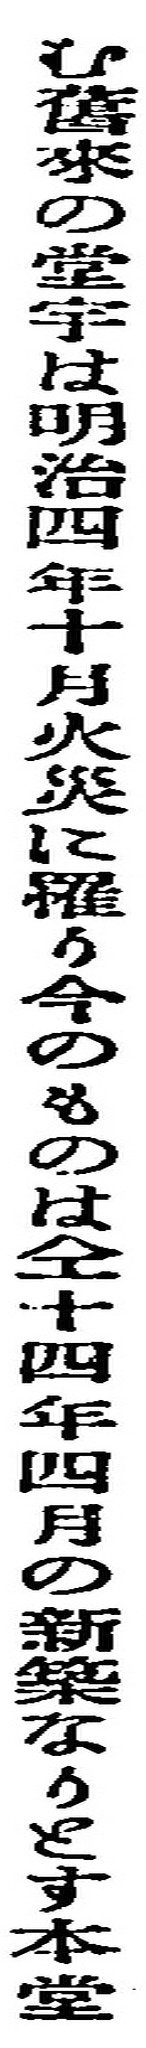む舊來の堂宇は明治四年十月火災を罹り今のものは仝十四年四月の新築なりとす本堂
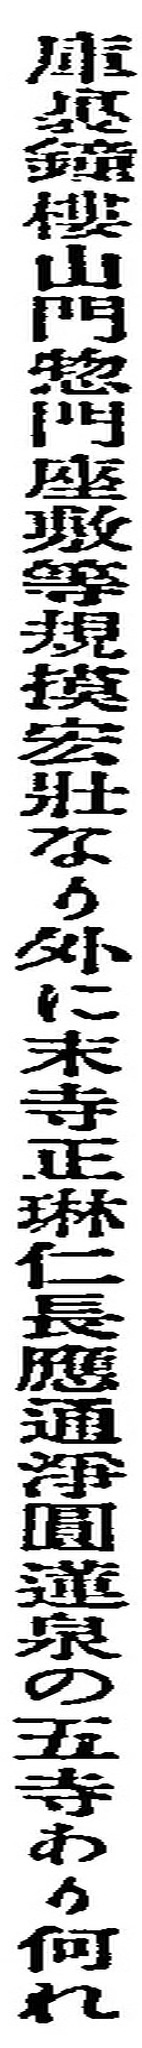庫裏鐘樓山門惣門座敷等規摸宏壯なり外に末寺正琳仁長應通淨圓蓮泉の五寺あり何れ
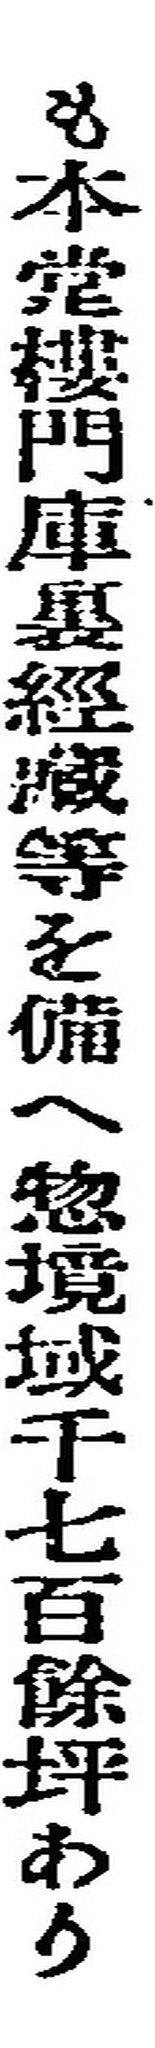も本堂樓門庫裏經藏等を備へ惣境域千七百餘坪あり
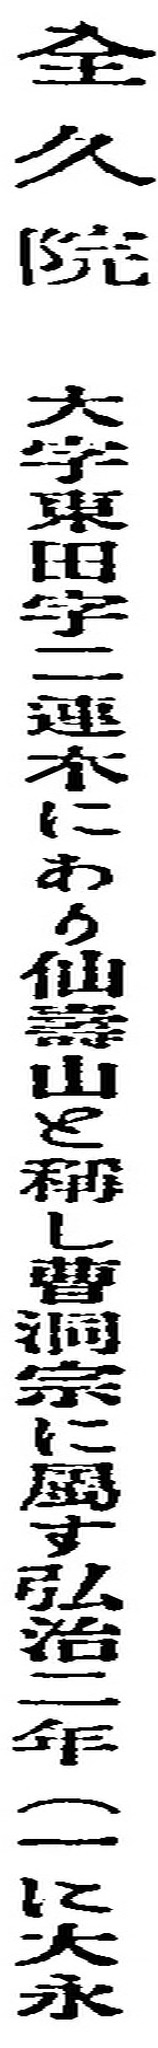全久院大字東田字二連木にあり仙壽山と稱し曹洞宗に屬す弘治二年(一に大永
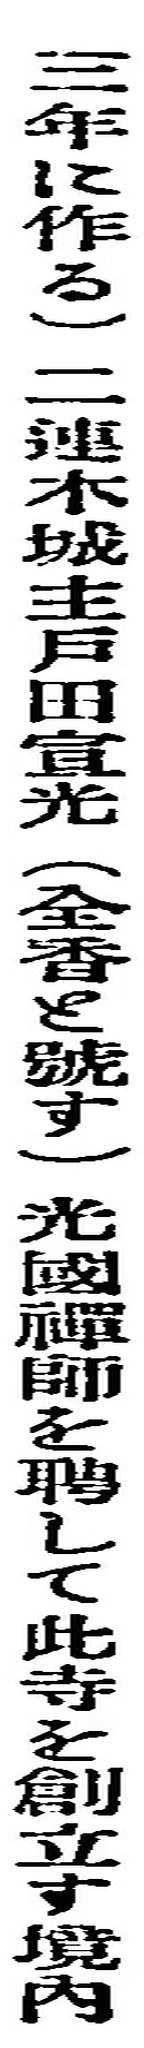三年に作る)二連木城主戸田宣光(全香と號す)光國禪師を聘して此寺を創立す境内
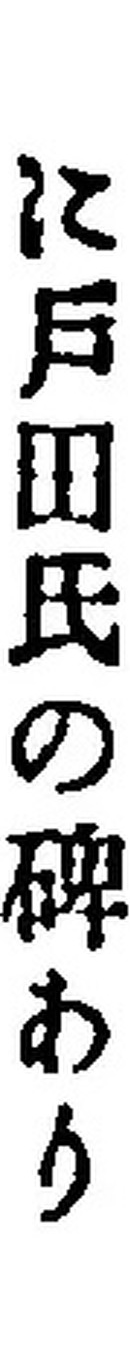に戸田氏の碑あり
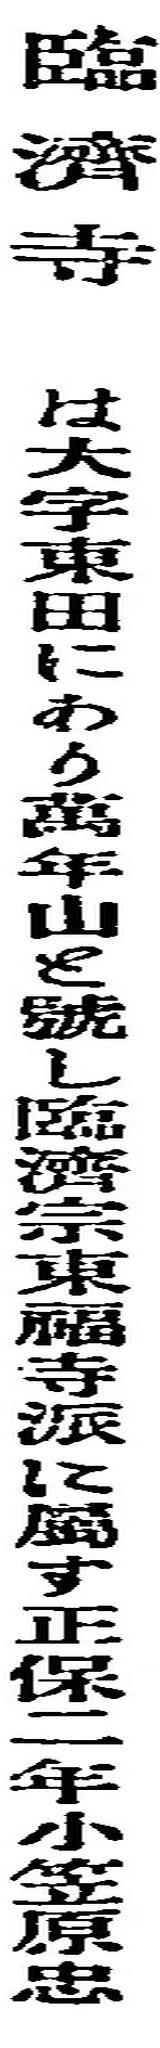臨濟寺は大字東田にあり萬年山と號し臨濟宗東福寺派に屬す正保二年小笠原忠
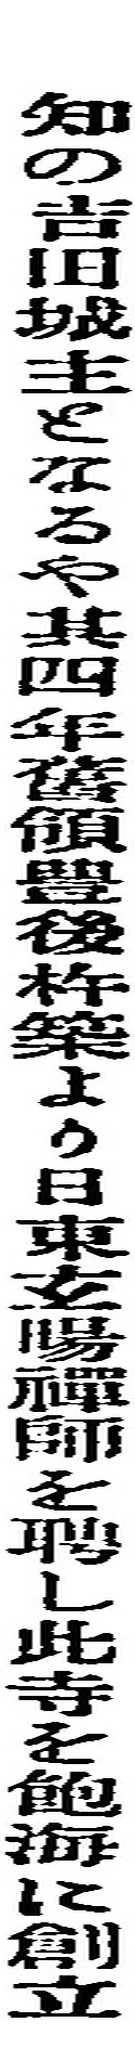知の吉田城主となるや其四年舊領豊後杵築より日東玄暘禪師を聘し此寺を飽海に創立
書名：豊橋志要
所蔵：国立国会図書館 National Diet Library, JAPAN
